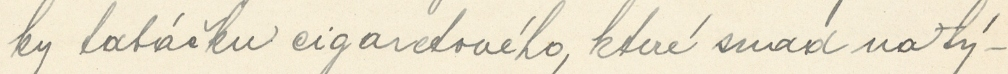ky tabáčku cigaretového, které snad na tý-
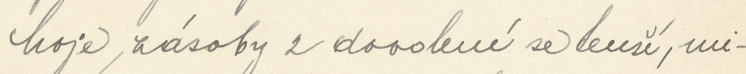Moje, zásoby z dovolené se tenší, mi-
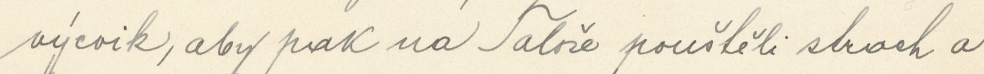výcvik, aby pak na Taloře pouštěli strach a
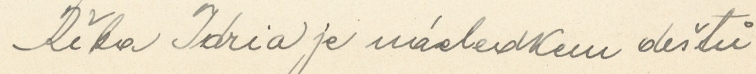Řeka Idria je následkem dešťů
